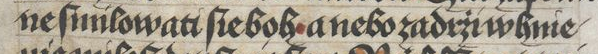ne ſmilowati ſie boh.a nebo zadrżi whnie¬
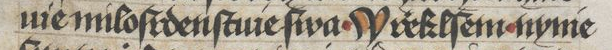uie miloſrdenſtuie ſwa.Yṙeklſem.nynie
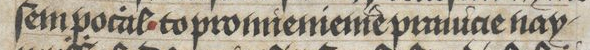ſem poċal.to promienienie prauicie nay¬
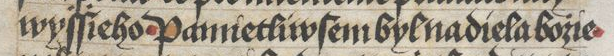wyẛẛieho.Pamietliwſem byl na diela bożie.
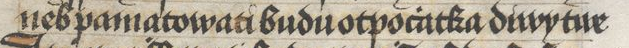neb pamatowati budu otpoċatka diwy tue
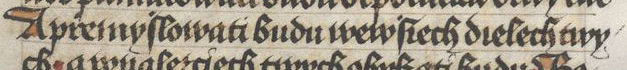A pṙemyẛlowati budu wewẛiech dielech twy¬
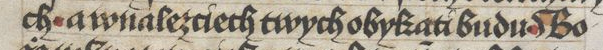ch.a wnalezciech twych obykati budu.Bo¬
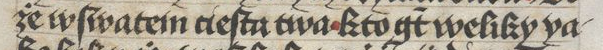że wſwatem cieſta twa.kto ḡt weliky ya¬
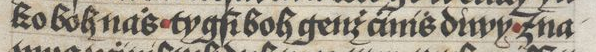ko boh naṡ.ty gſi boh genż ċiniṡ diwy.Zna¬
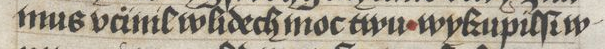mus vċinil wlidech moc twu.wykupilſi w¬
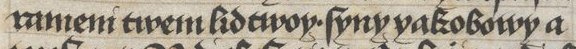rameni twem lid twoy.ſyny yakobowy a
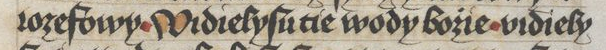iozefowy.Vidielyſu tie wody bożie.vidiely
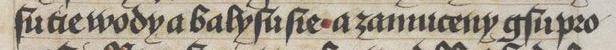ſu tie wody a baly ſu ſie.a zamuceny gſu pro¬
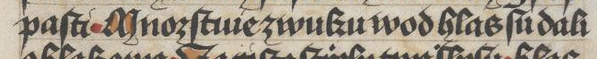paſti.Mnozſtuíe zwuku wod hlas ſu dali
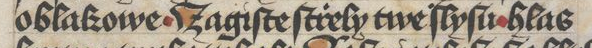oblakowe.Zagiſte ſtṙely twe ẛlyſu.hlas
